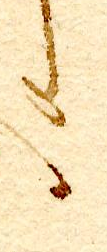To
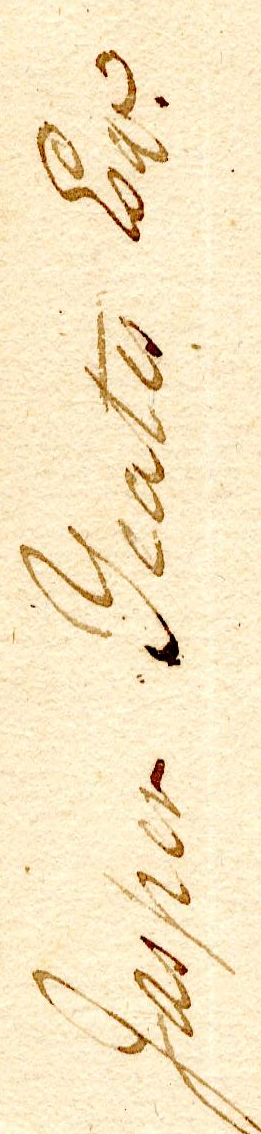Jasper Yeates Esq^r.
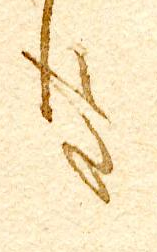at
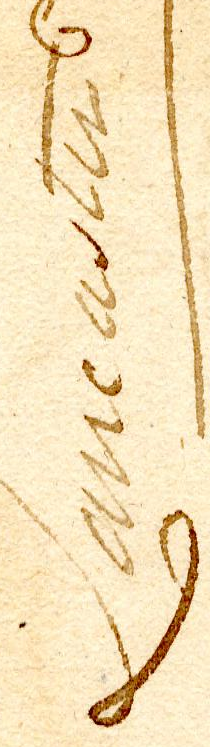Lancaster
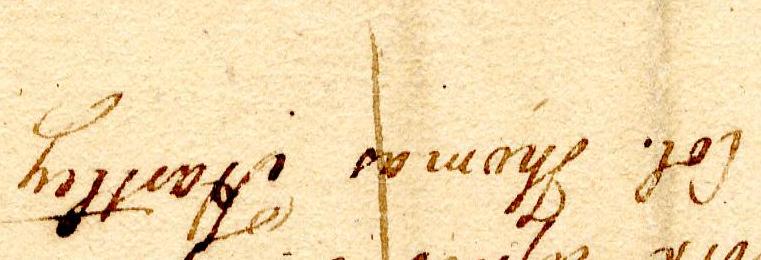Col. Thomas Hartley
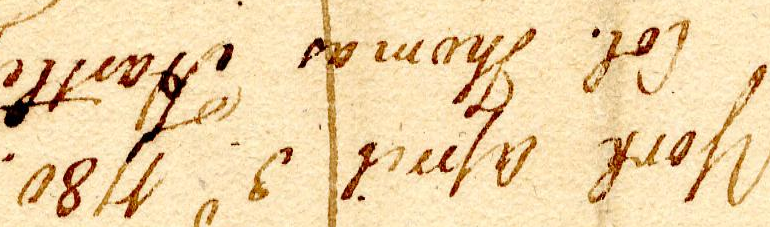York April 3^d 1780.
